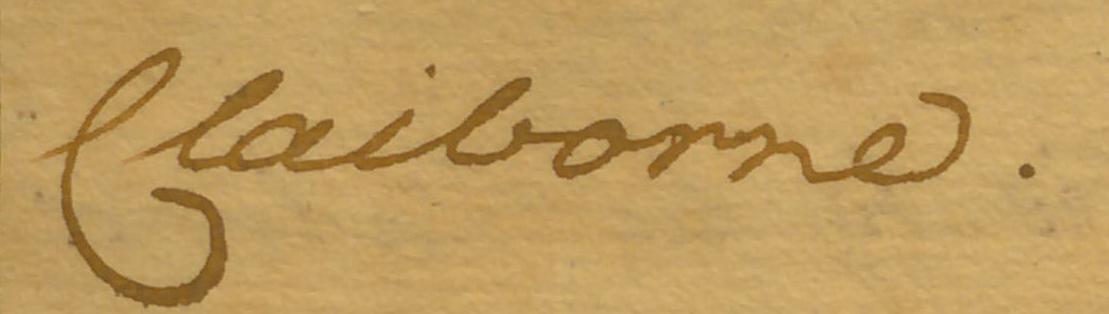Claiborne.
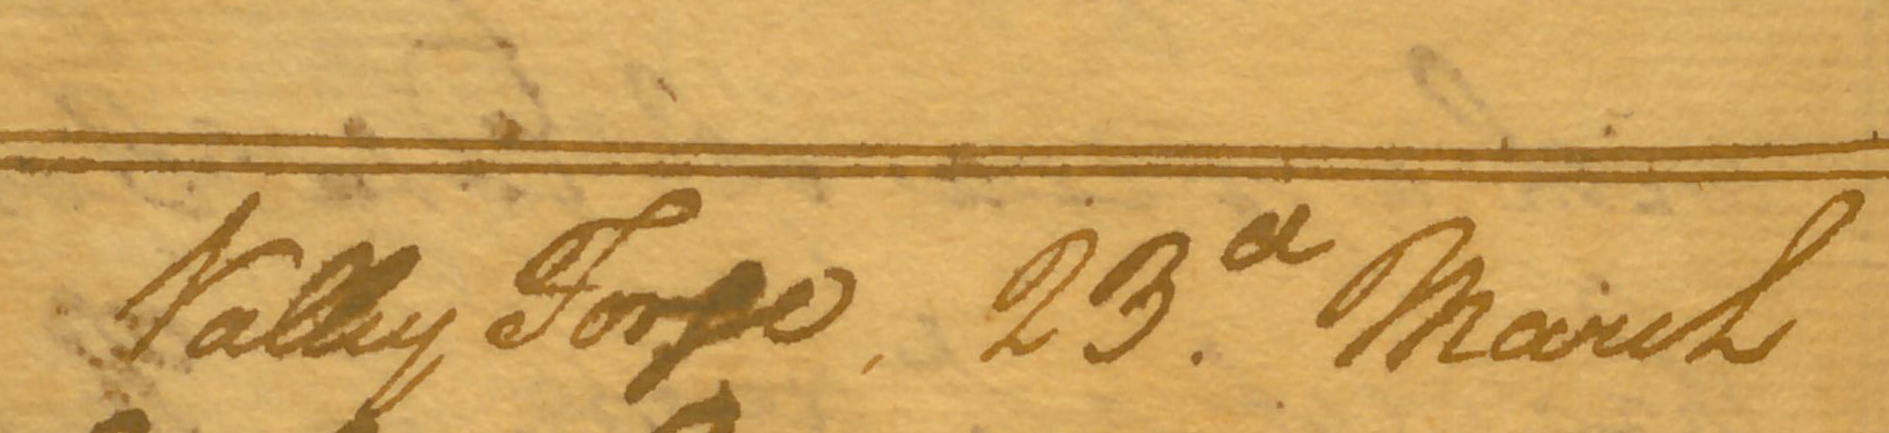Valley Forge, 23^d. March
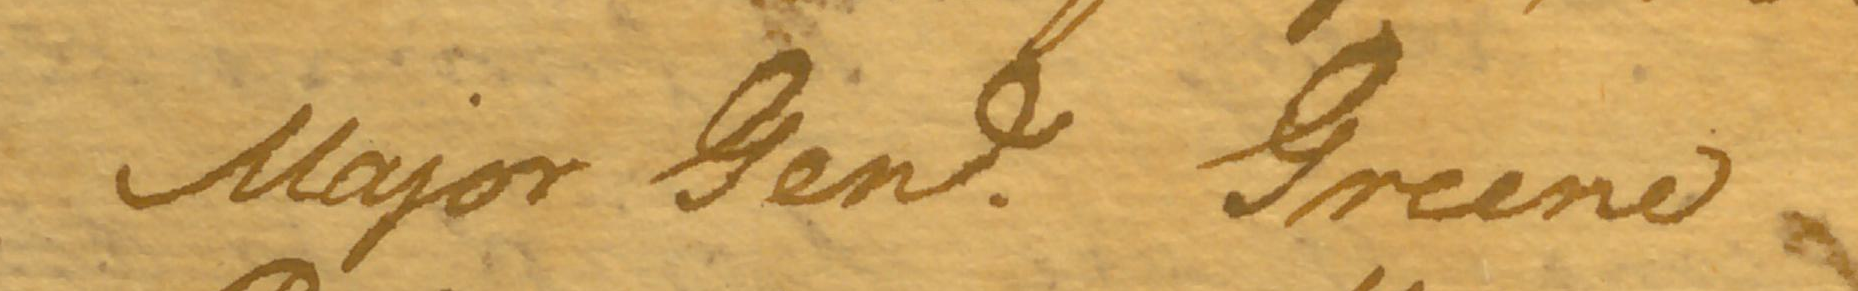Major Gen^l. Greene
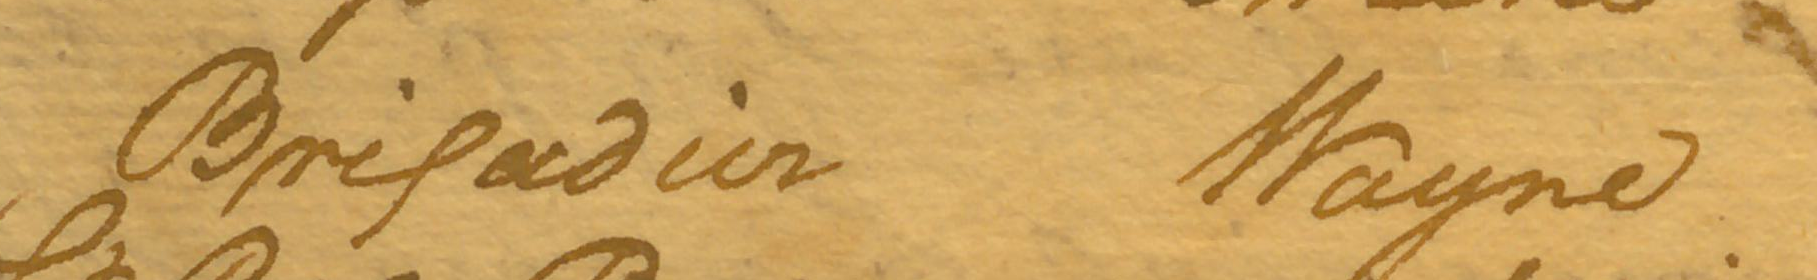Brigadier Wayne
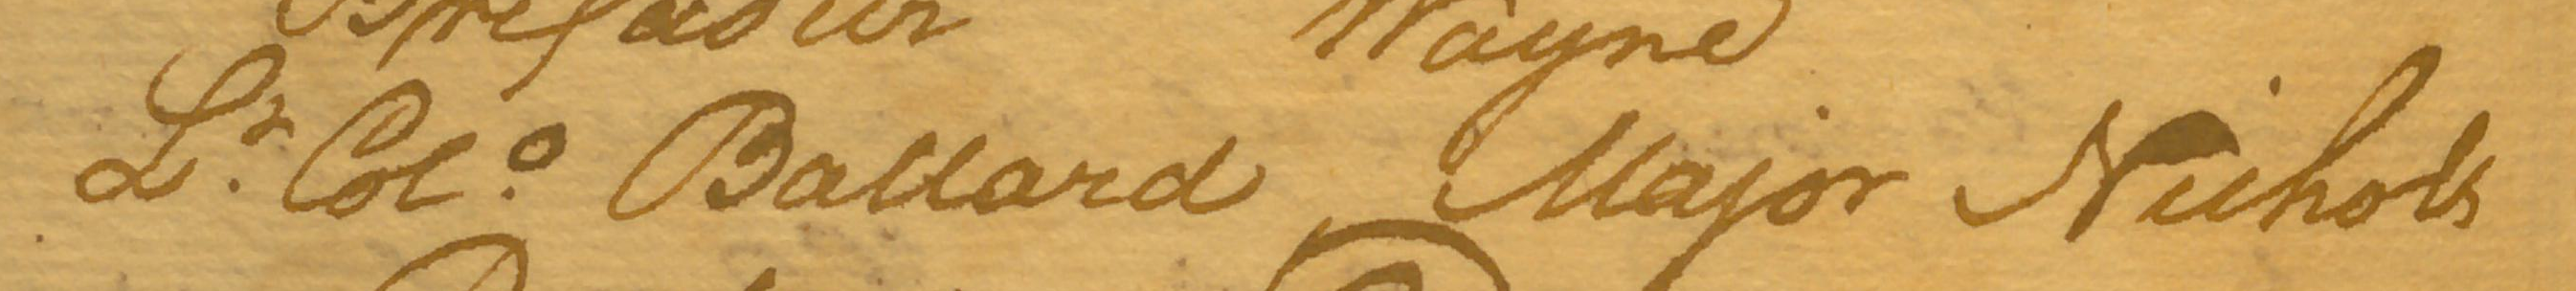L^t. Col^o. Ballard Major Nichols
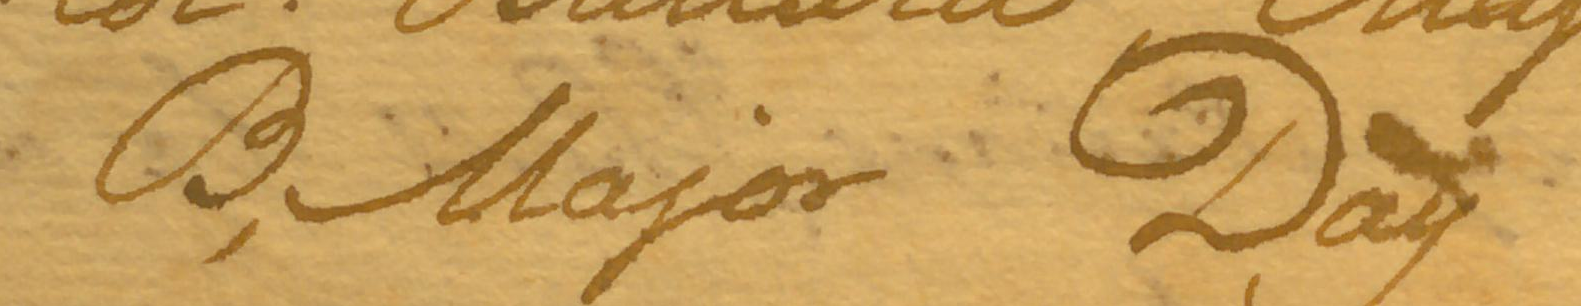B, Major Day
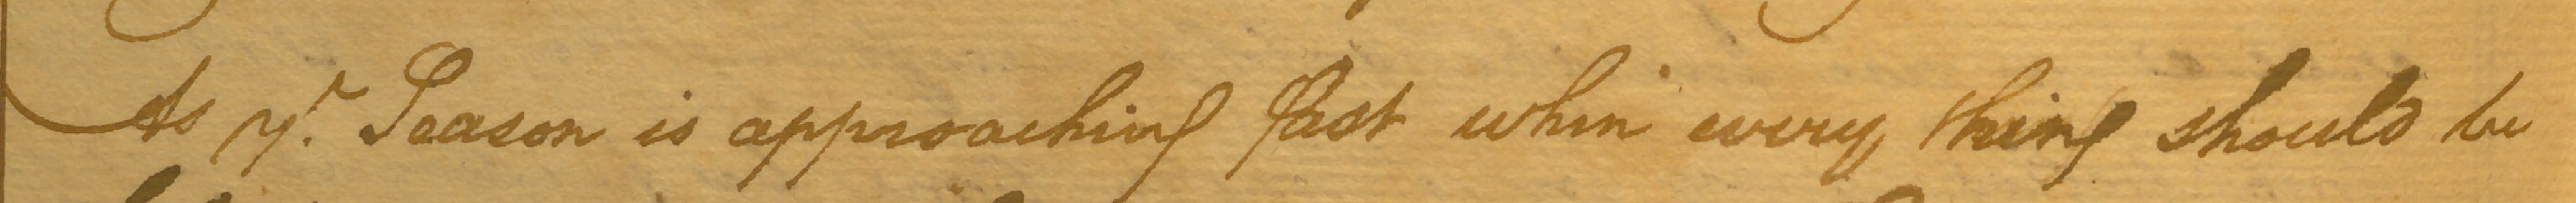As y^e. Season is approaching fast when every thing should be
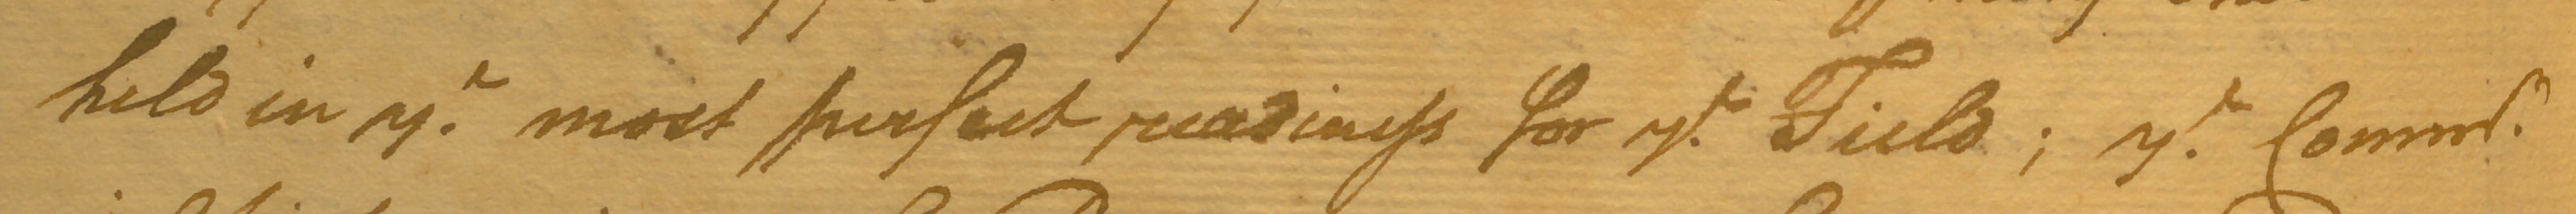held in y^e. most perfect readiness for y^e. Field; y^e. Comm^r.
